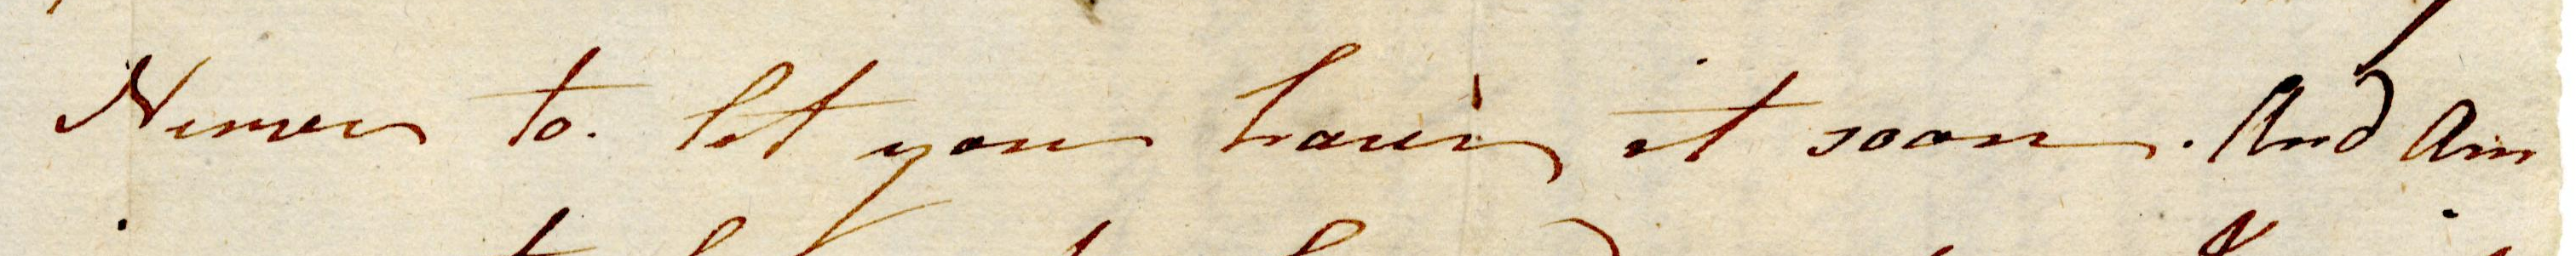Nimes to. let you have it soon. And Am
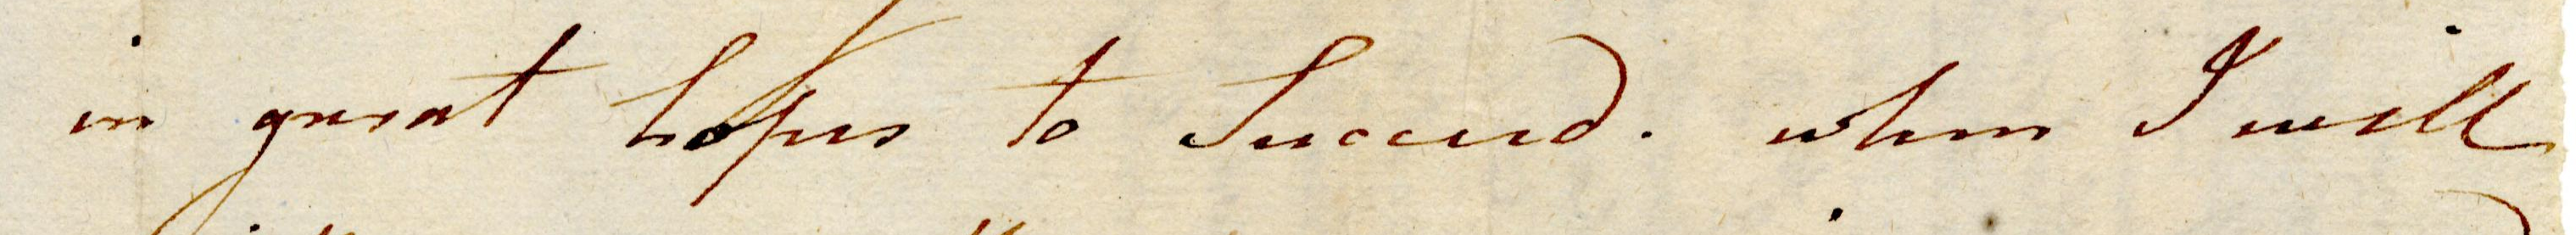in great hopes to Succeed. when I well
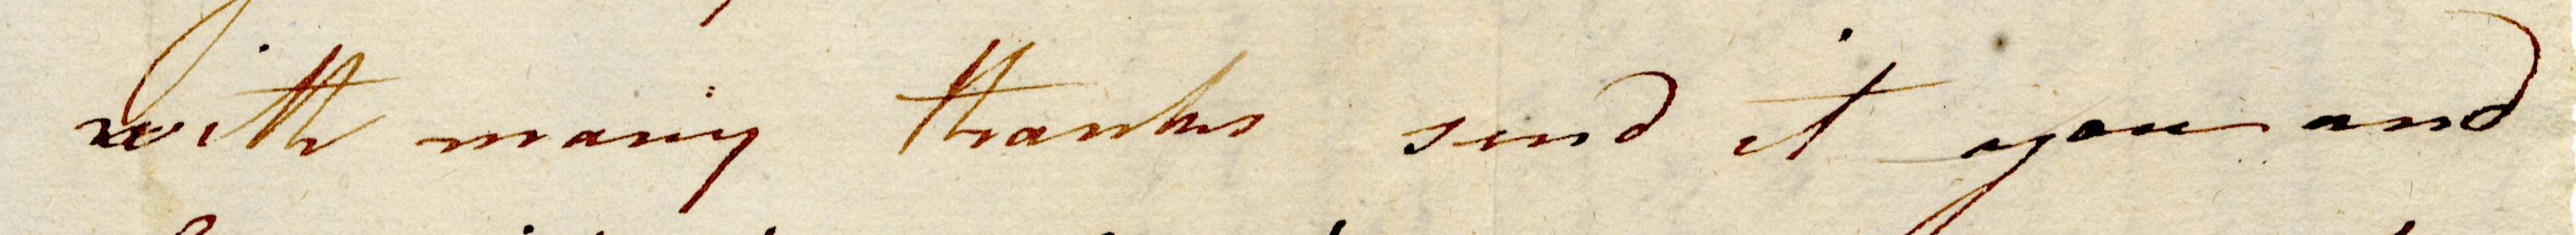with many thanks send it you and
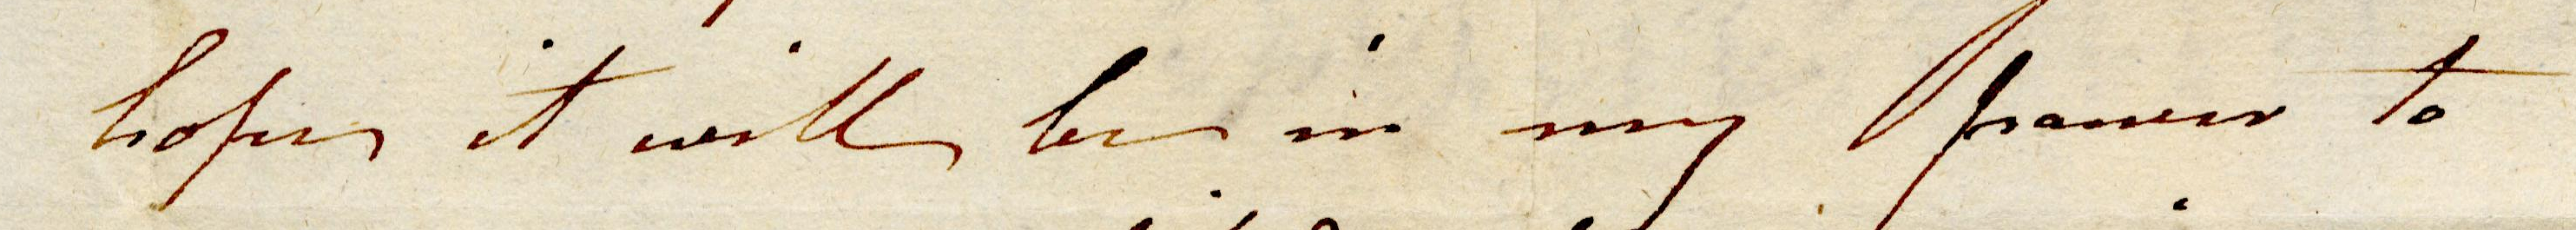hope it will be in my power to
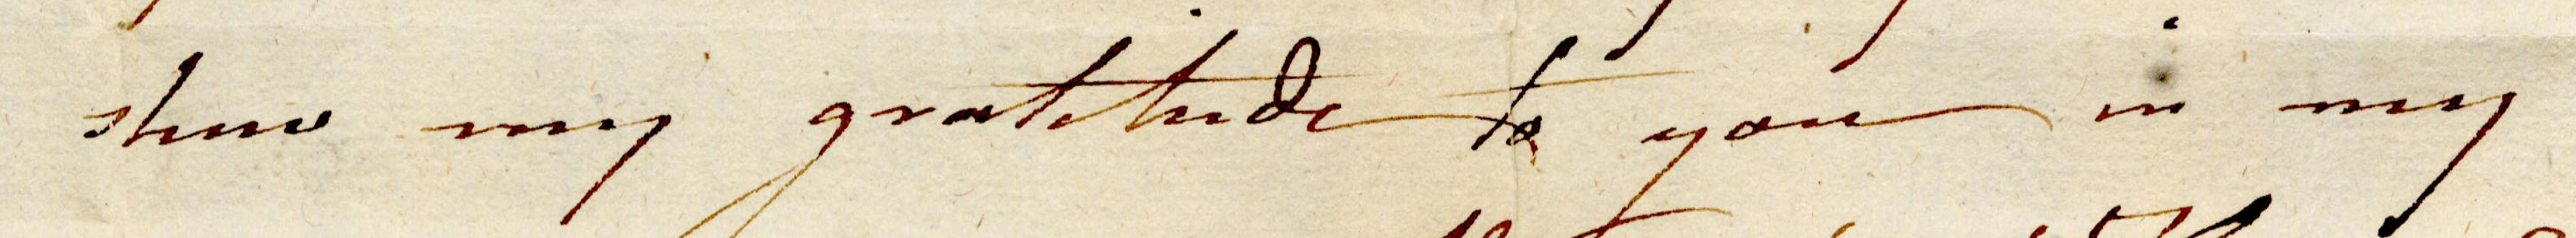show my gratitude to you in my
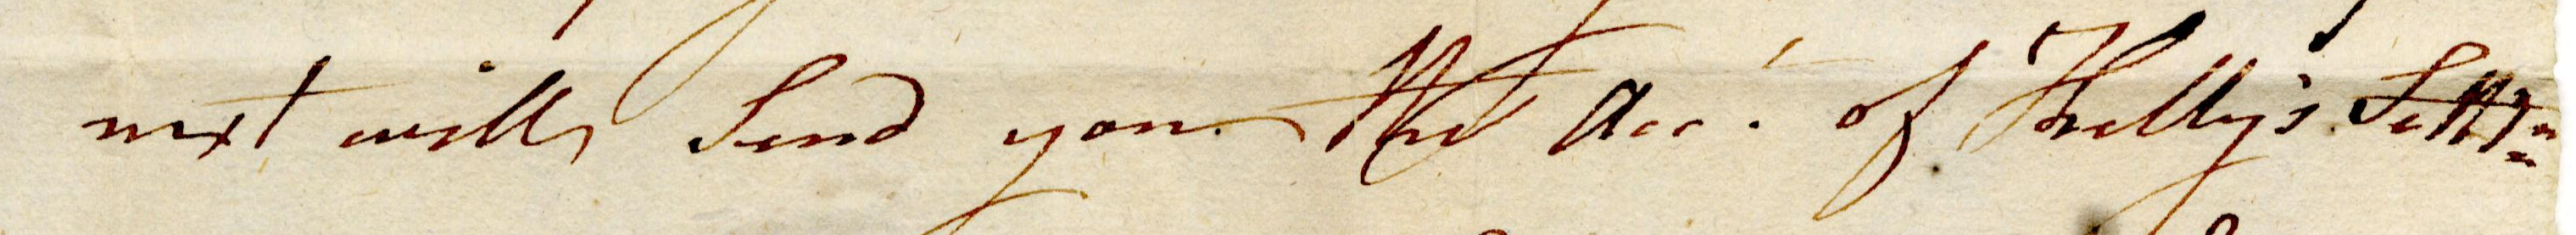next will, Send you the Acc^t. of Kelly's Settl^t
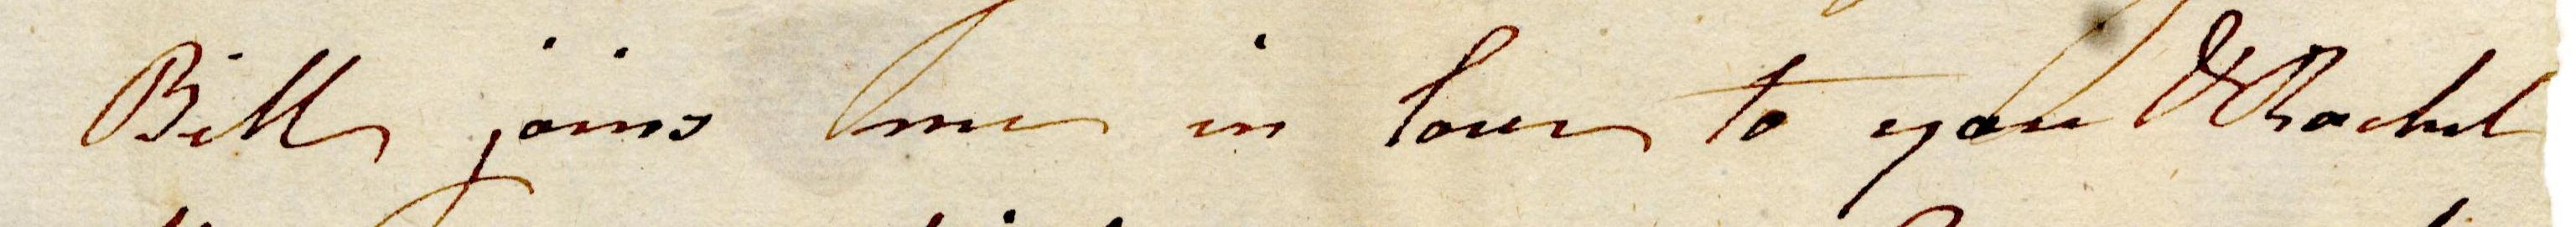Bell joins me in favor to you & Rachel
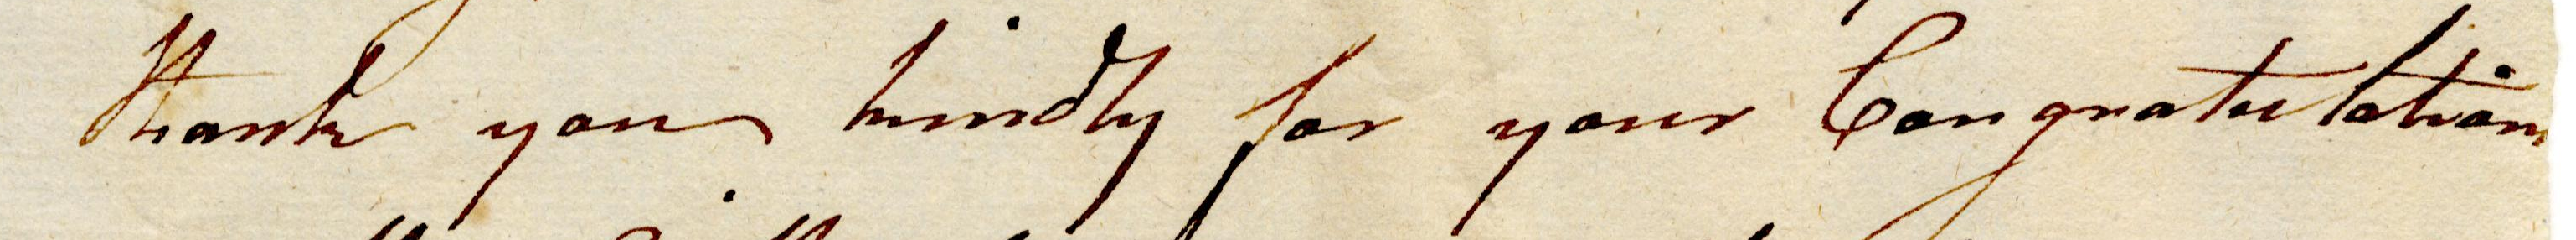thank you kindly for your Congratulation
